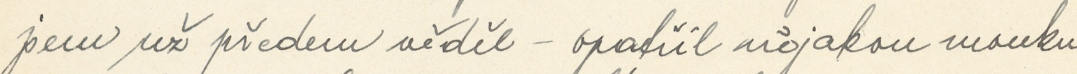jsem už předem věděl - opatřil nějakou mouku
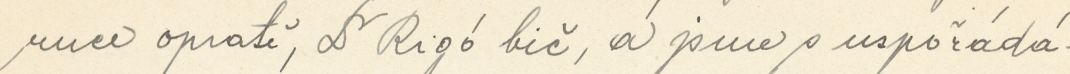ruce opratě, Dr Rigó bič, a jsme s uspořádá-
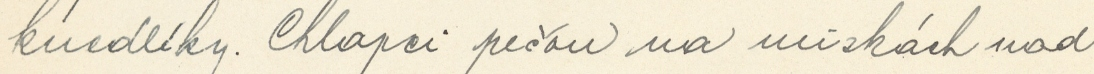knedlíky. Chlapci pečou na miskách nad
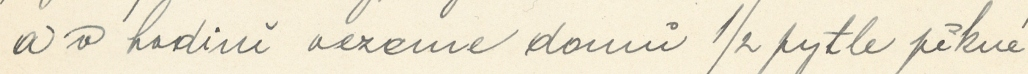a v hodině vezeme domů 1/2 pytle pěkné
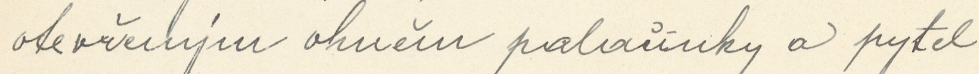otevřeným ohněm palačinky a pytel
